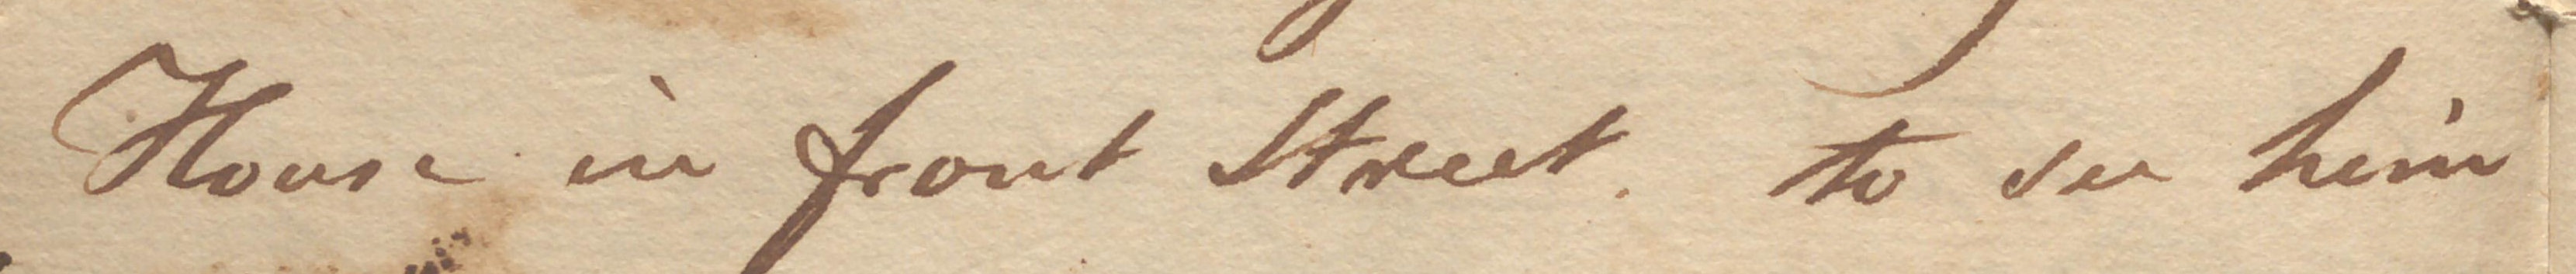House in front Street, to see him
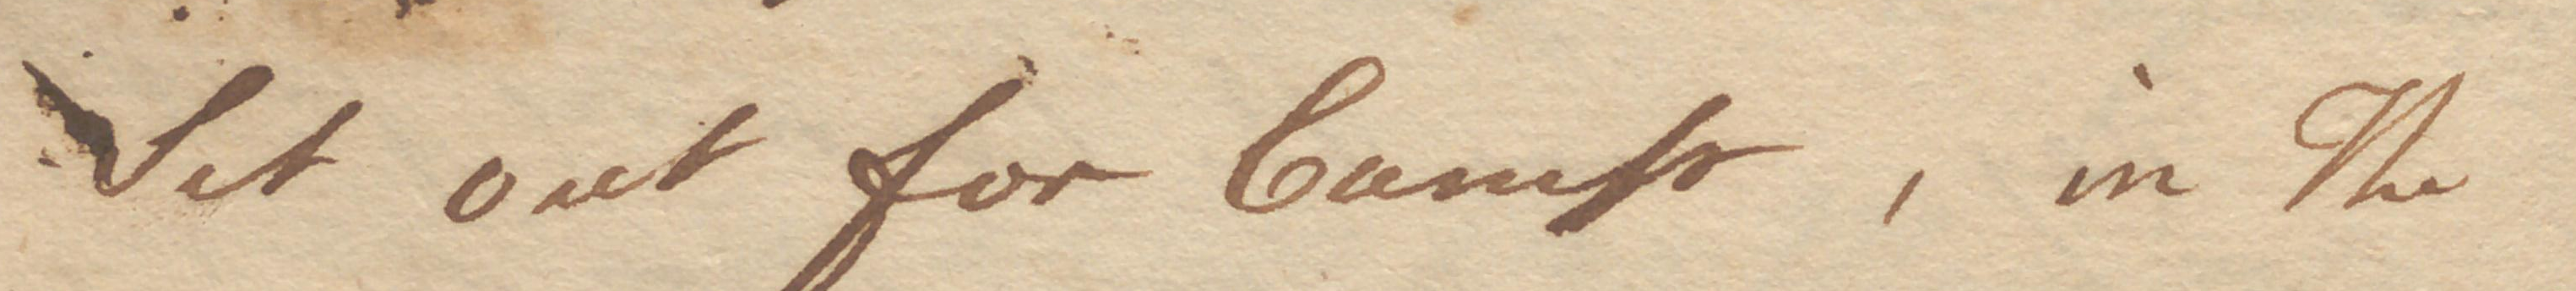Set out for Camp, in The
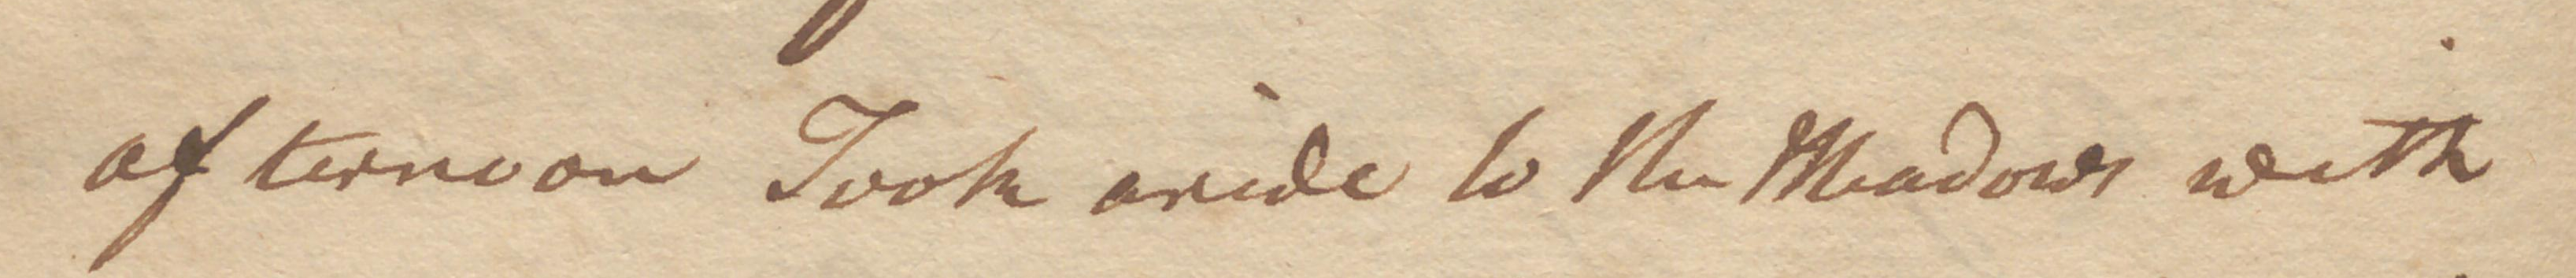afternoon Took a ride to the Meadows with
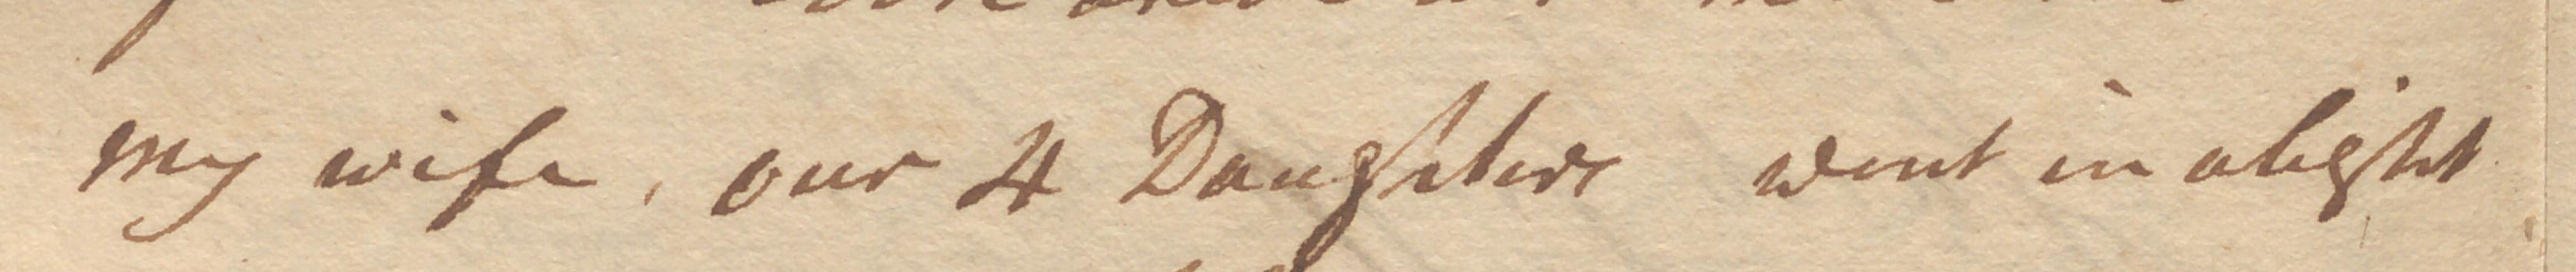my wife, our 4 Daughters went in a light
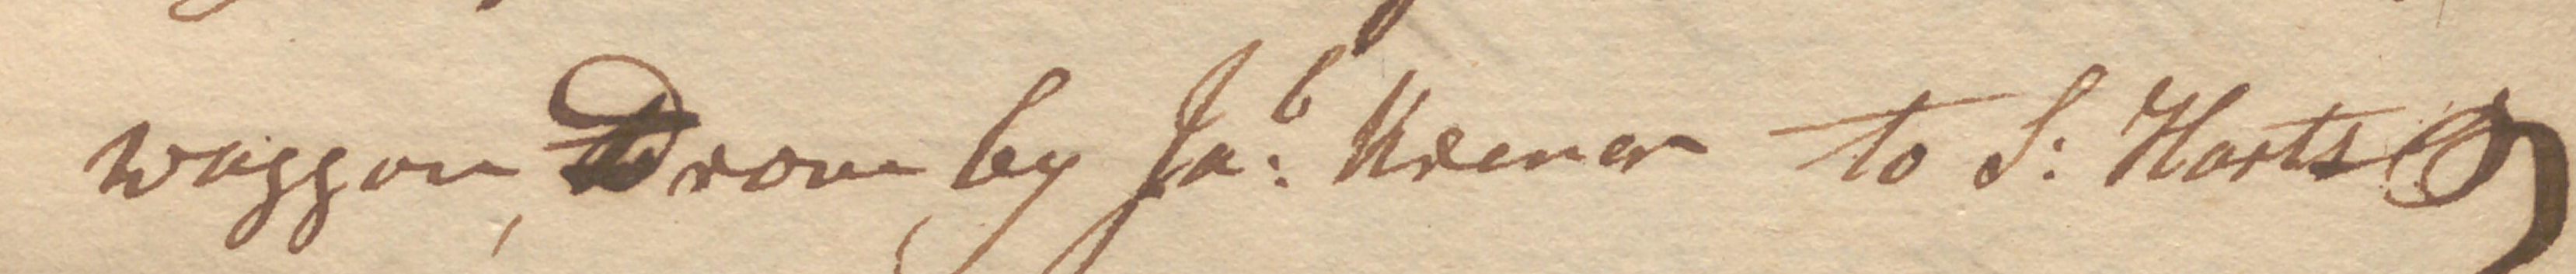waggon Drove by Ja^b. Keiner to S: Harts
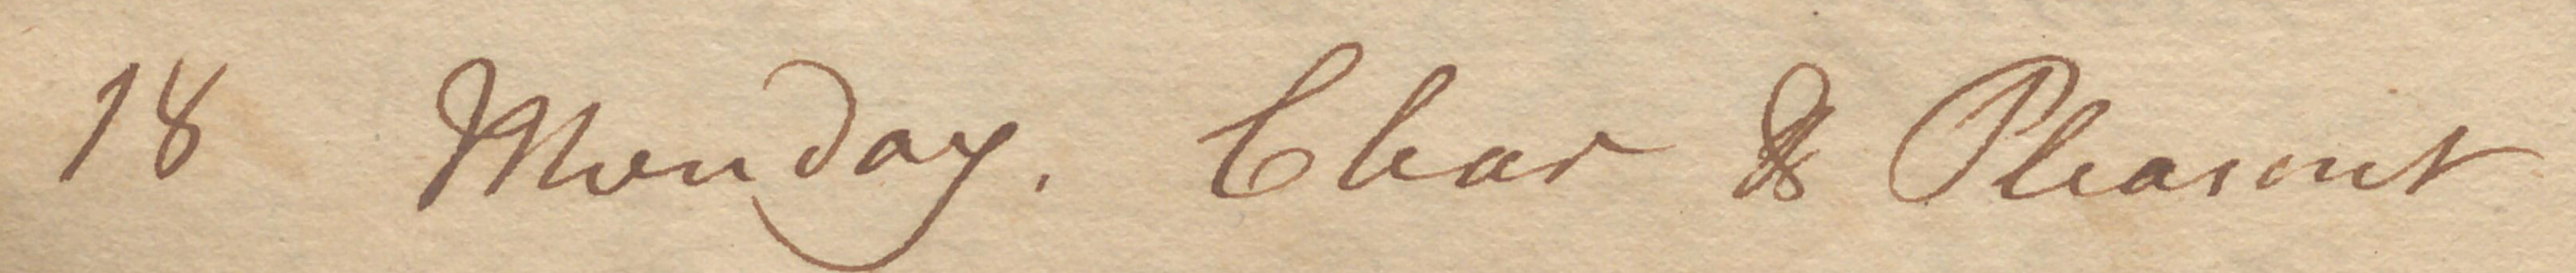18 Monday. Clear & Pleasent
